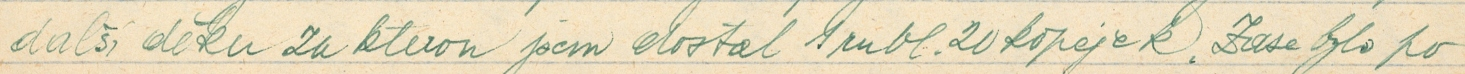další deku za kterou jsem dostal 1 rubl. 20 kopejek. Zase bylo po
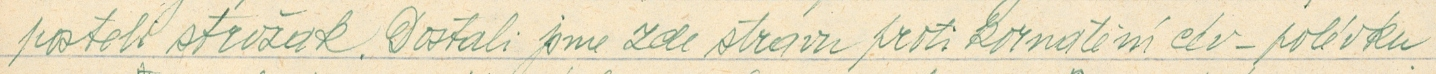posteli strožak. Dostali jsme zde stravu proti kornatění cév - polévku
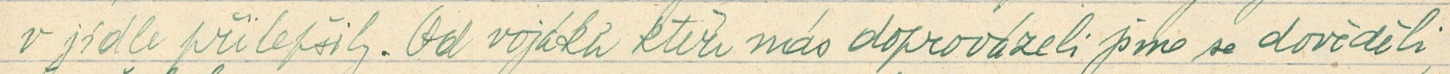v jídle přilepšily. Od vojáků kteří nás doprovázeli jsme se dověděli
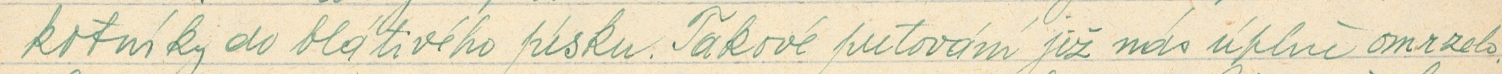kotníky do blátivého písku. Takové putování již nás úplně omrzelo.
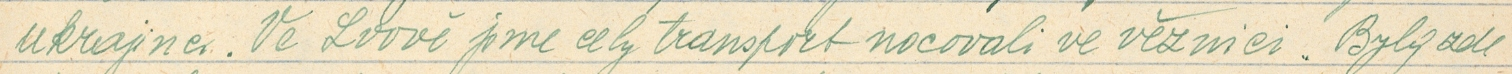ukrajinci. Ve Lvově jsme cely transport nocovali ve věznici. Byly zde
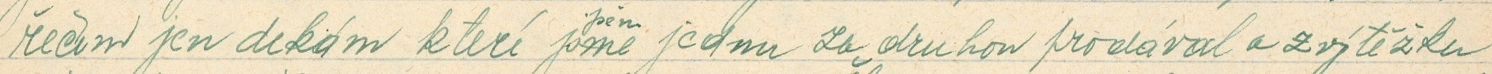řečím jen dekám které jsme jsem jednu za druhou prodával a z výtěžku
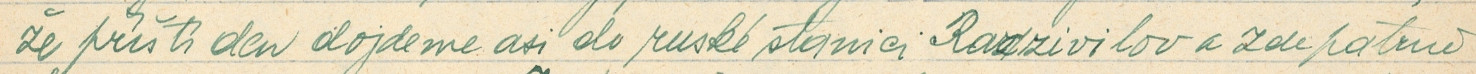že příští den dojdeme asi do ruské stanici Raczivilov a zde patrně
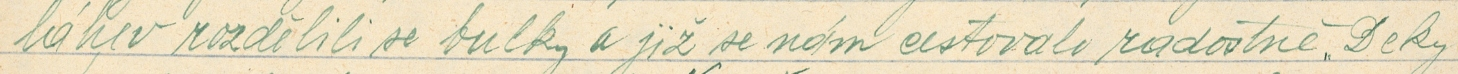láhev rozdělili se bulky a již se nám cestovalo radostně. Deky
